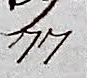77
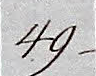49
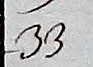33
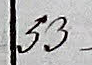53
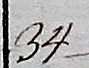34
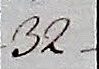32
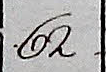62
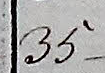35
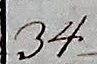34
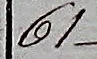61
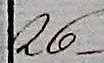26
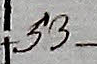53
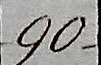90
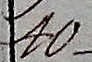40
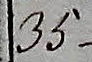35
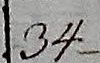34
